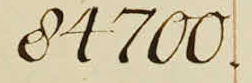84700
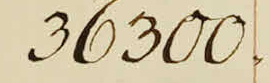36300
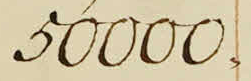50000
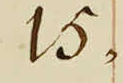15
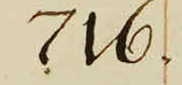716
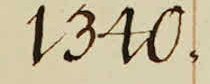1340
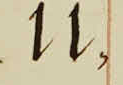11
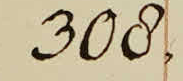308
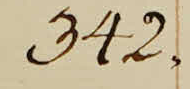342
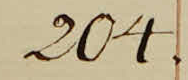204
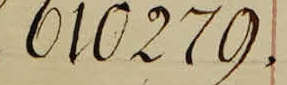610279
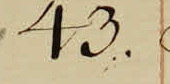43.
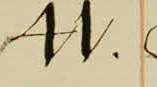41.
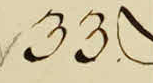33.
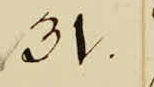31.
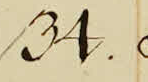34.
